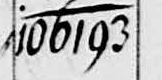106193
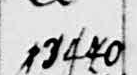13440
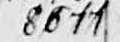8677
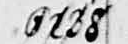6238
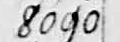8090
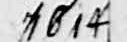7614
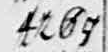4265
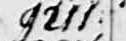9211
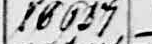16637
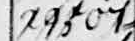29507
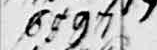6597
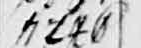7246
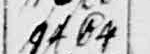9464
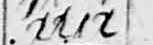2212
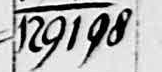129198
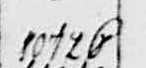19726
